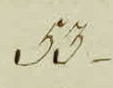53
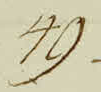49
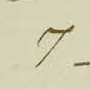7
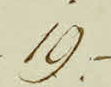19
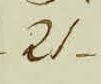21
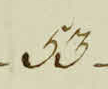53
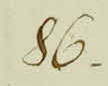86
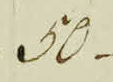50
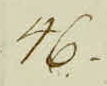46
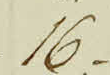16
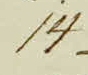14
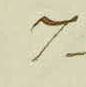7
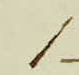1
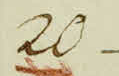20
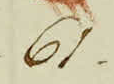61
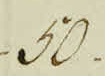50
